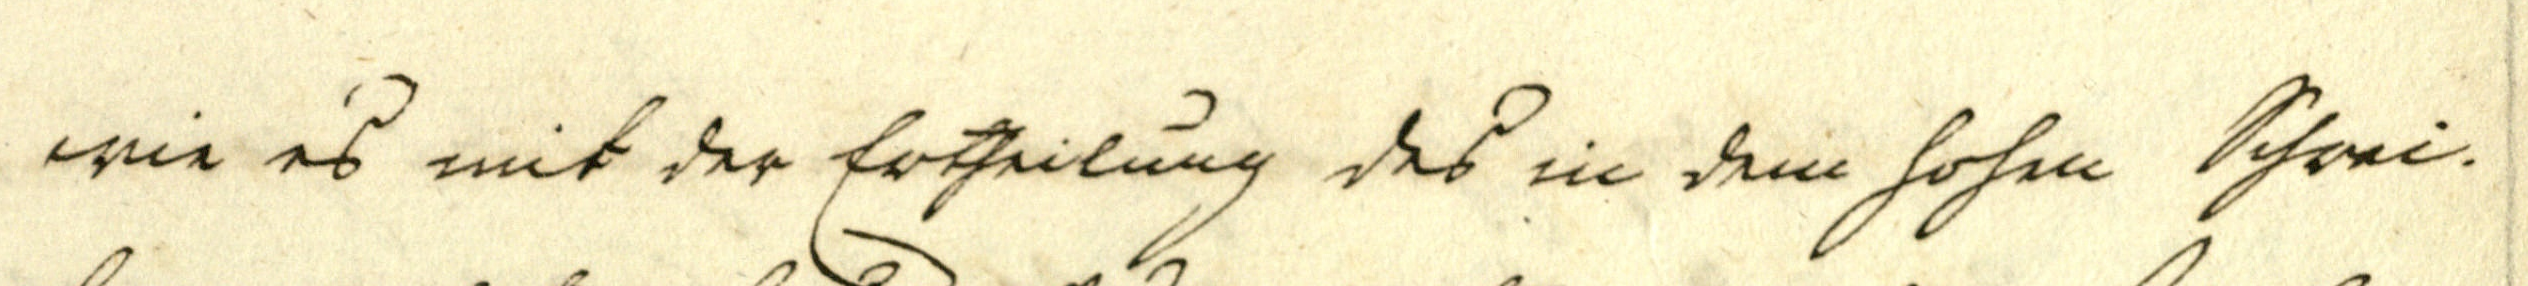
wie es mit der Ertheilung des in dem hohen Schrei¬
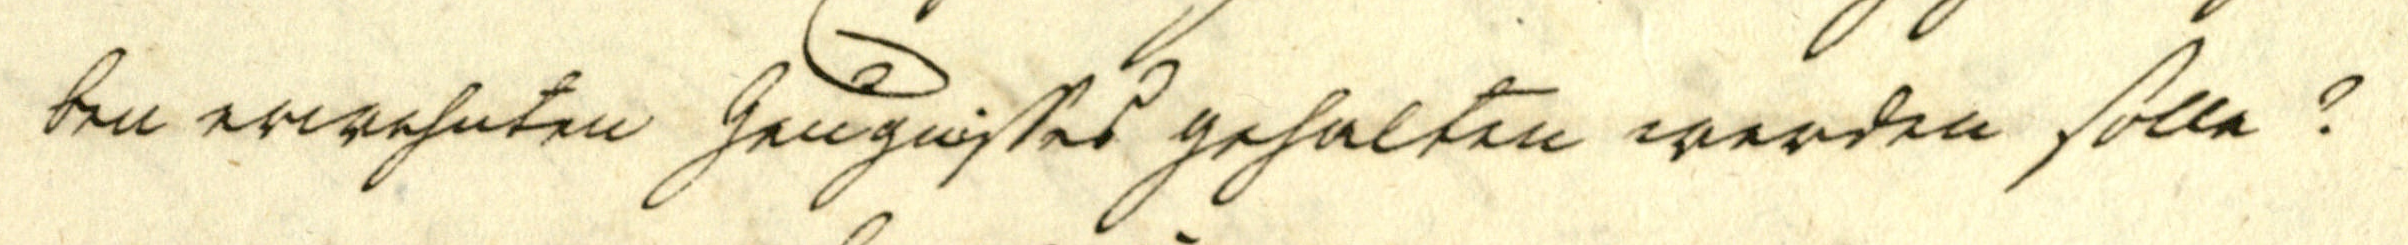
den erwehnten Zeugnisses gehalten werden solle?
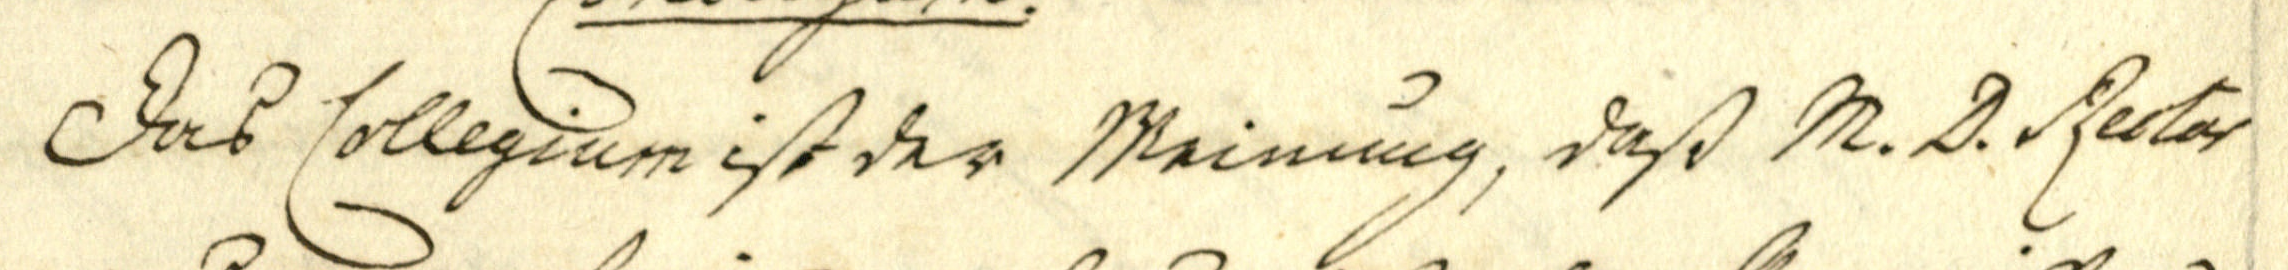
Das Collegium ist der Meinung, daß M. D. Rector
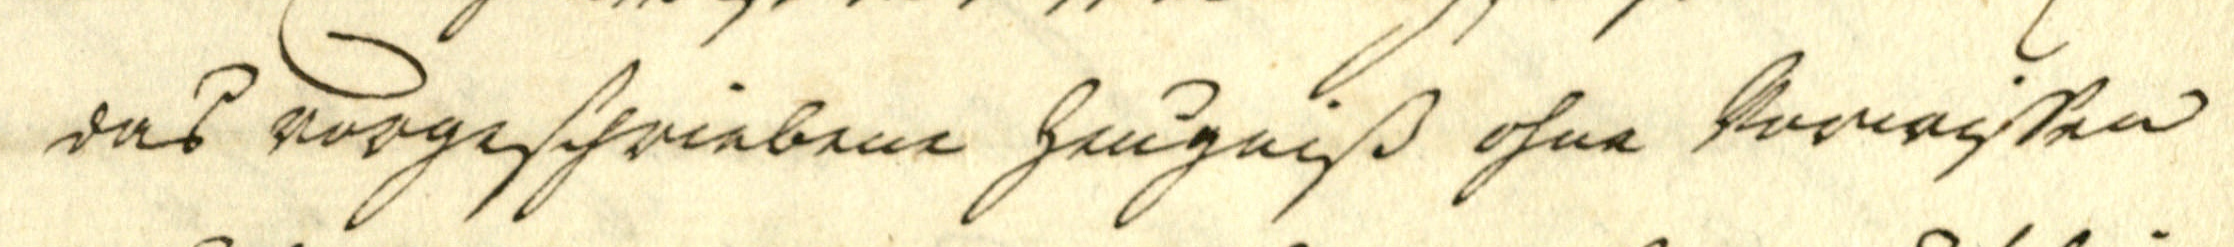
das vorgeschriebene Zeugniß ohne Vorwissen
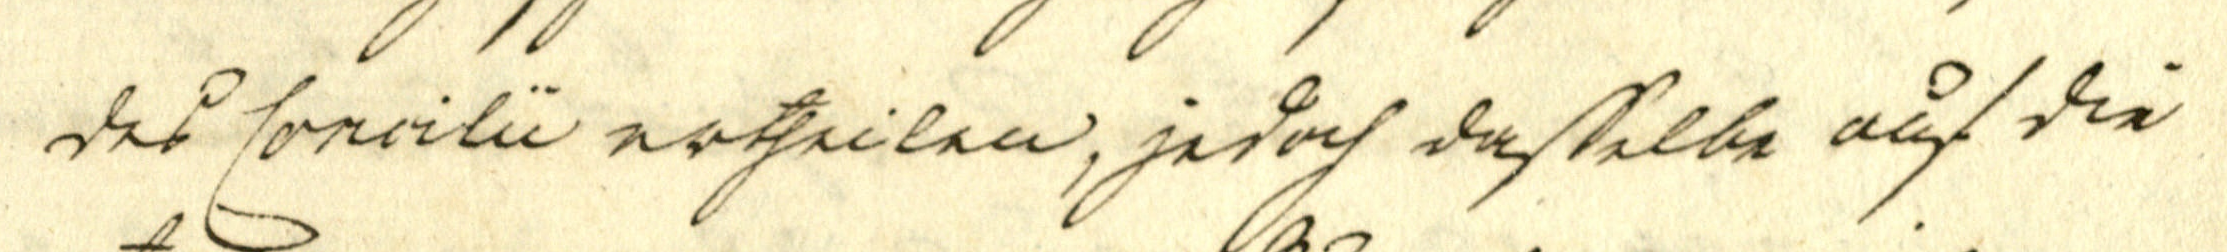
des Concilii ertheilen, jedoch dasselbe auf die
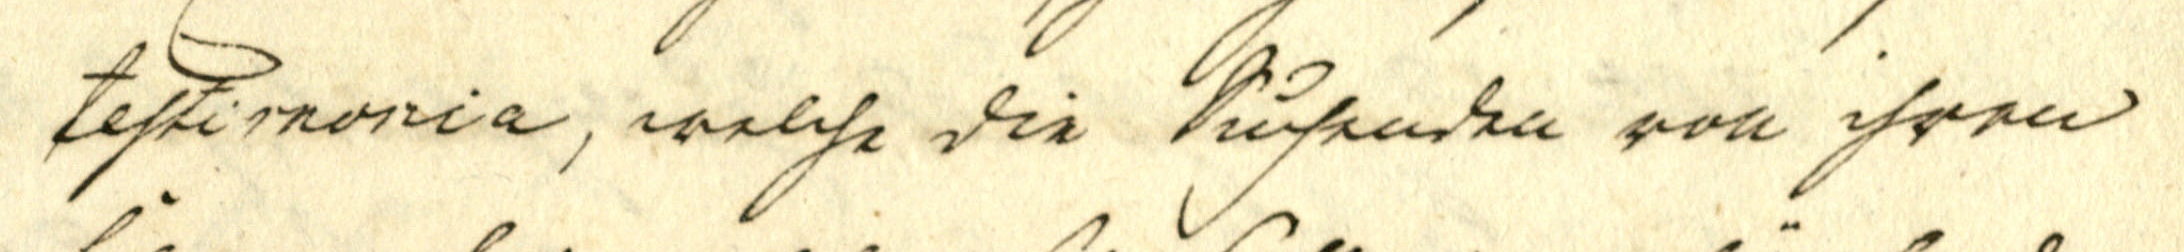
testimonia, welche die Suchenden von ihren
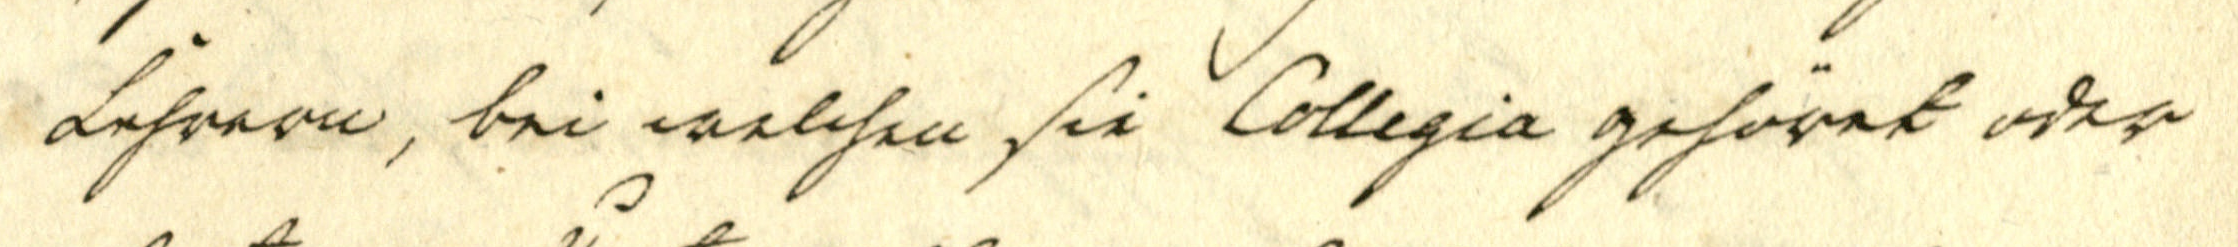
Lehrern, bei welchen sie Collegio gehöret oder
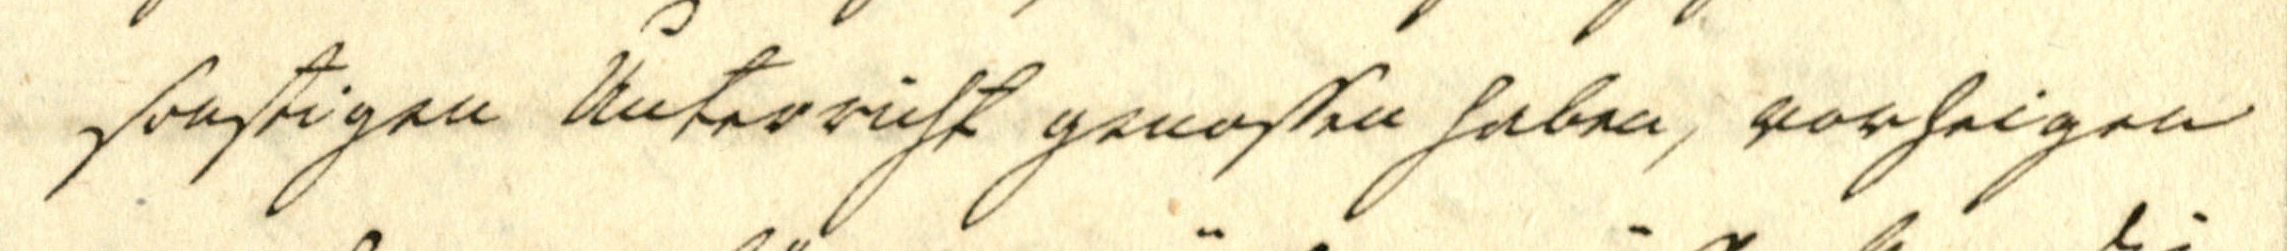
sonstigen Unterricht genossen haben, vorzeigen
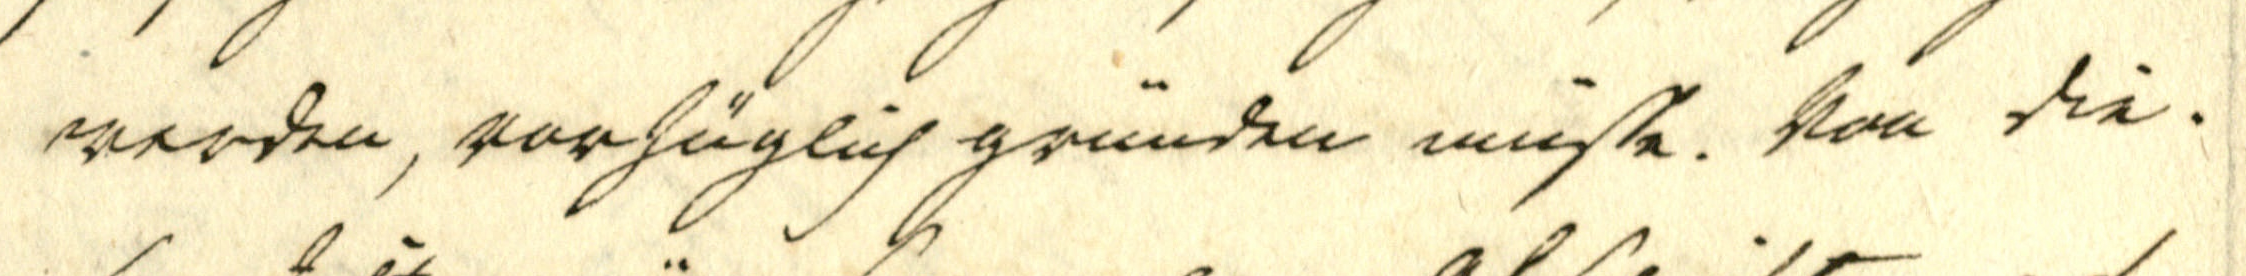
werden, vorzüglich gründen müsse. Von die-
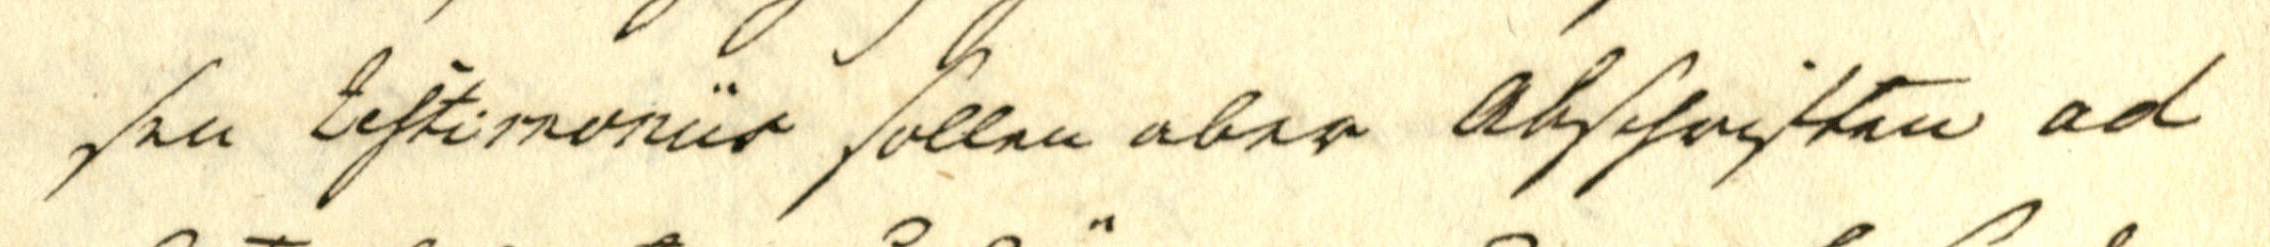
sen testimoniis sollen aber Abschriften ad
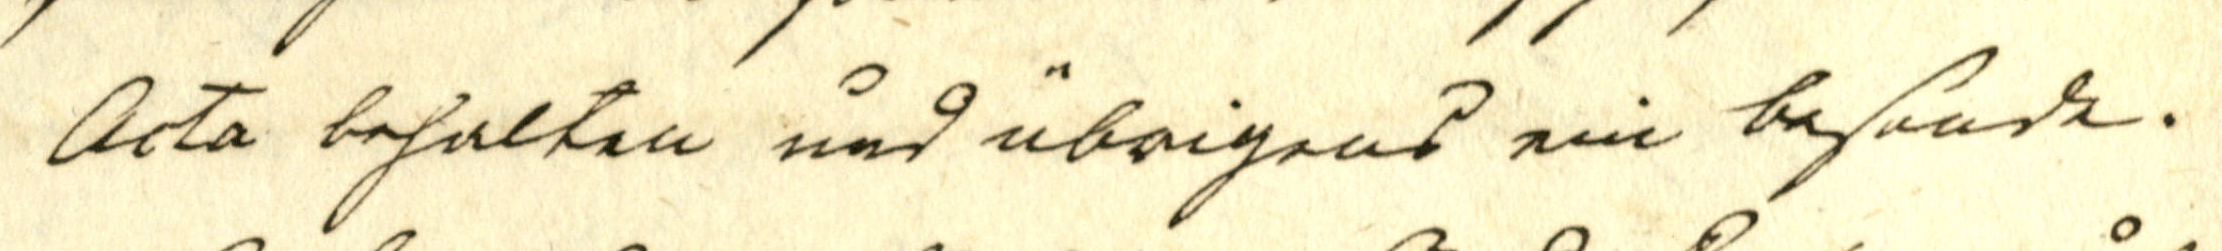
Acta behalten und übrigens ein besonde¬
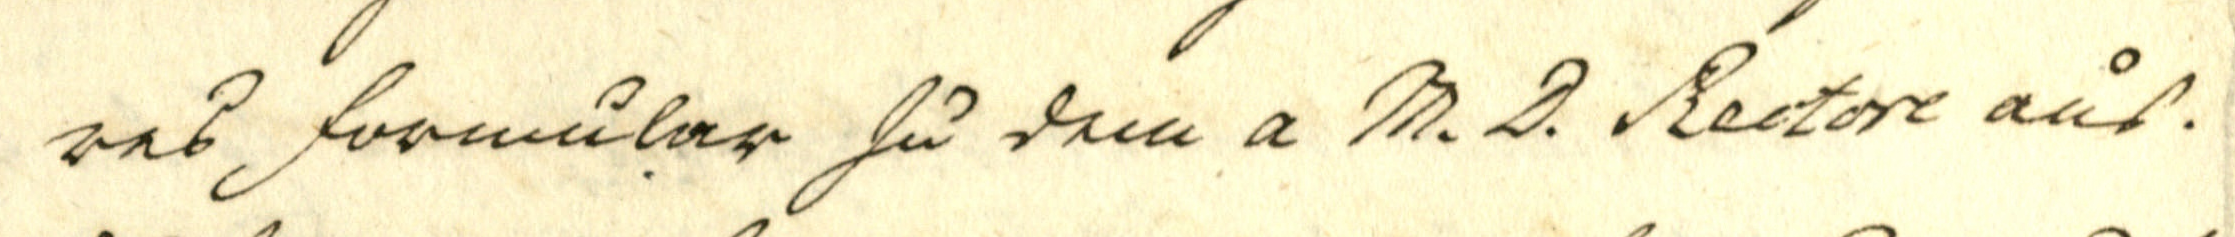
res Formular zu dem a M. D. Rectore aus¬
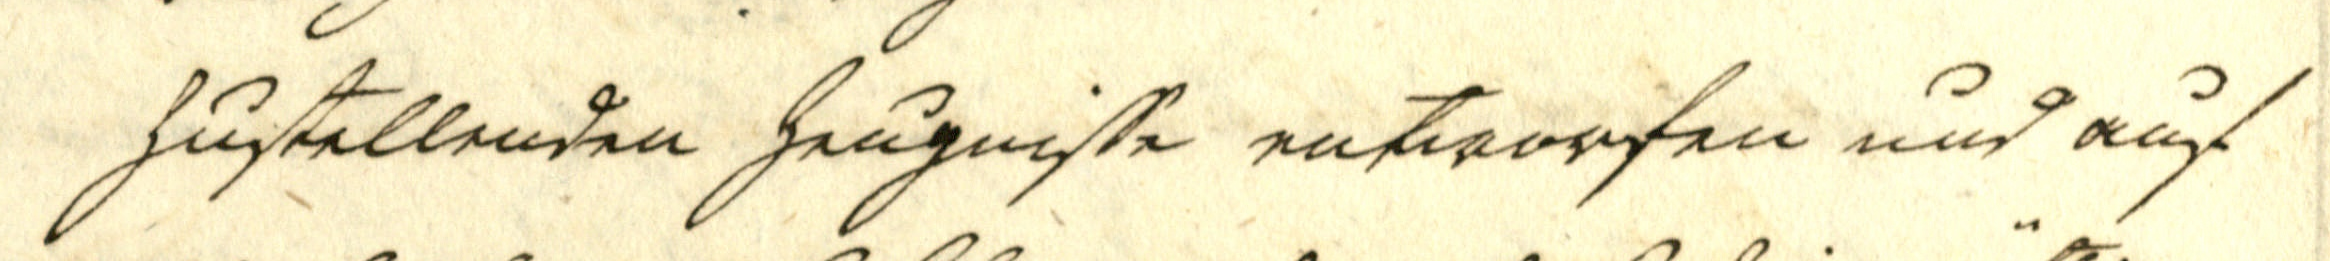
zustellenden Zeugnisse entworfen und auf
